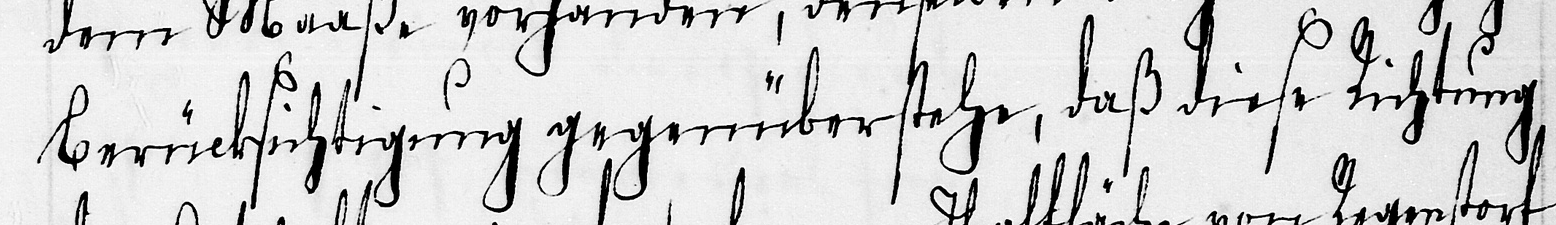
Berücksichtigung gegenüberstehe, daß diese Richtung
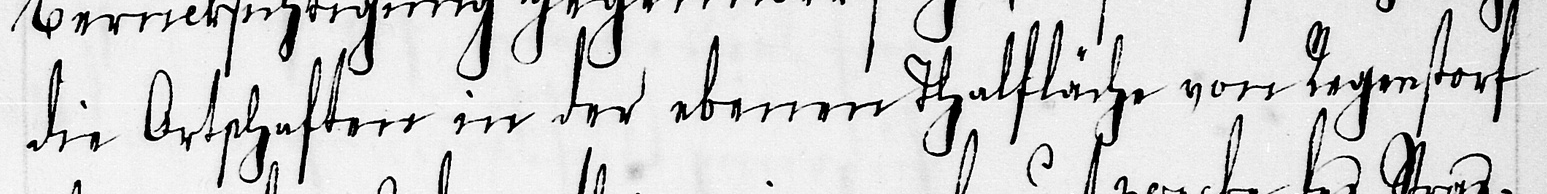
die Ortschaften in der ebenen Thalfläche von Regenstorf
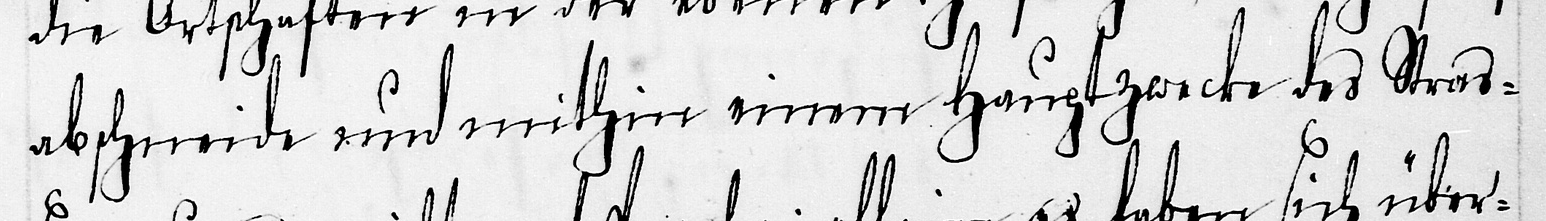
abschneide und mithin einem Hauptzwecke des Stra¬
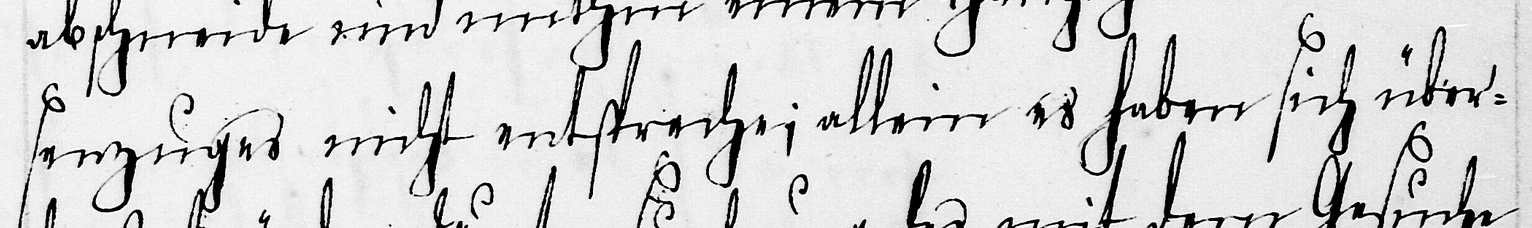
ßenzuges nicht entspreche; allein es haben sich über¬
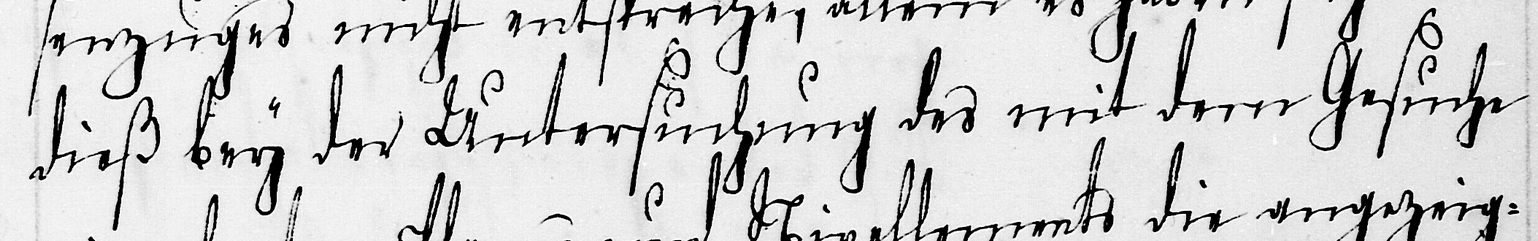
dieß bey der Untersuchung des mit dem Gesuche
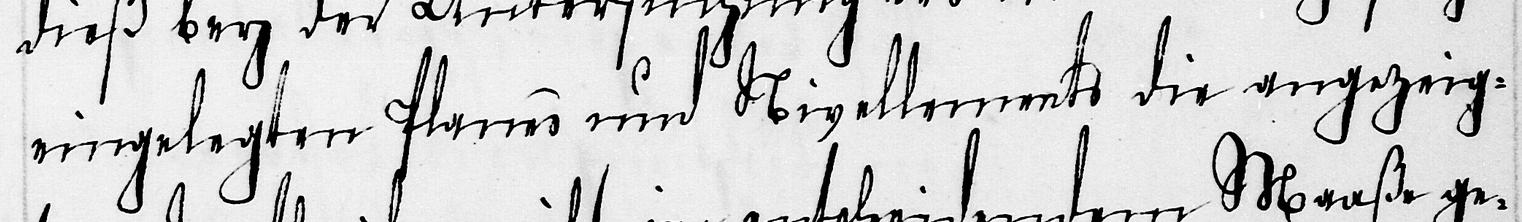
eingelegten Planes und Nivellements die angezeig¬
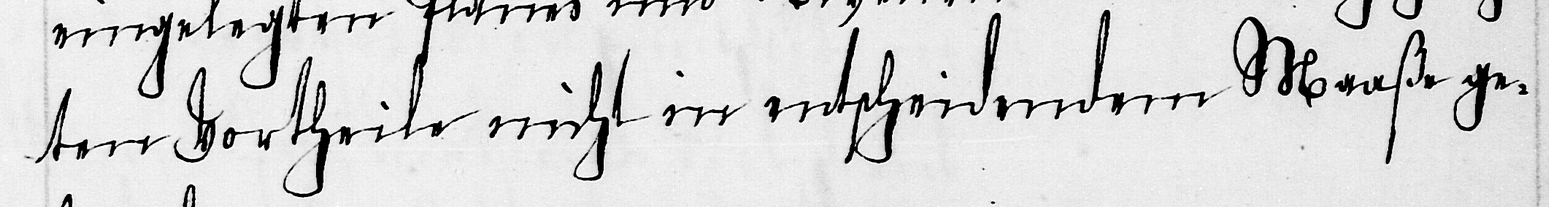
ten Vortheile nicht in entscheidendem Maaße ge¬
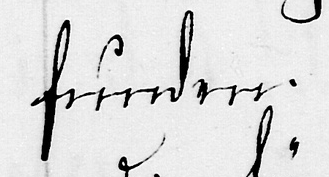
funden.
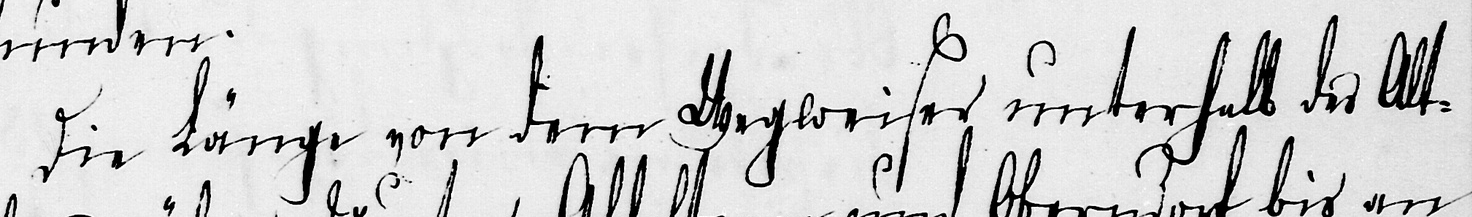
Die Länge von dem Wegweiser unterhalb des Alt¬
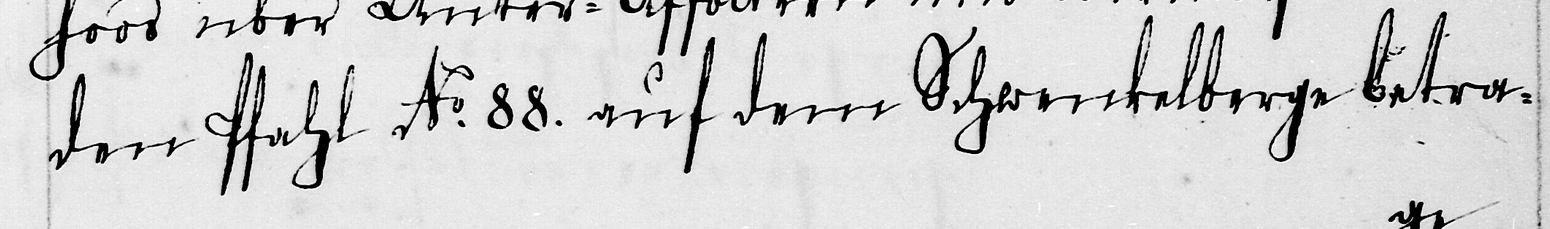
den Pfahl No. 88. auf dem Schwenkelberge betra-
